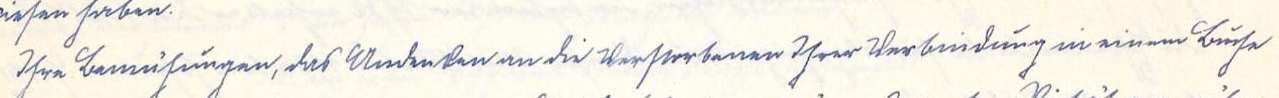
Ihre Bemühungen, das Andenken an die Verstorbenen Ihrer Verbindung in einem Buche der
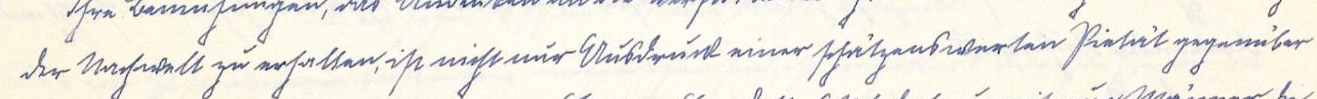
der Nachwelt zu erhalten, ist nicht nur Ausdruck einer schätzenswerten Pietät gegenüber
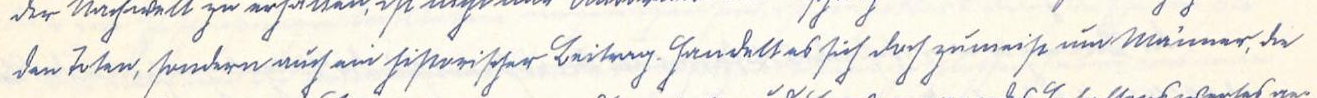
den Toten, sondern auch ein historischer Beitrag. Handelt es sich doch zumeist um Männer, die
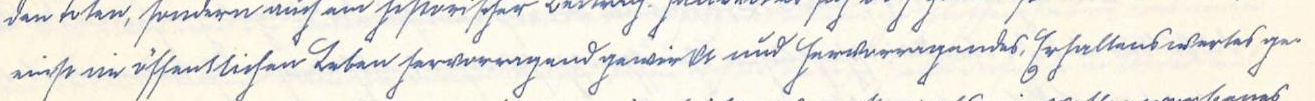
nicht im öffentlichen Leben hervorragend gewirkt und Hervorragendes, Erhaltenswertes ge-
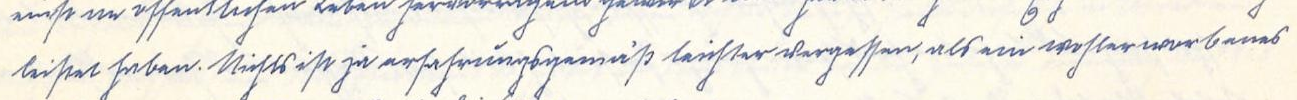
leistet haben. Nichts ist ja erfahrungsgemäß leichter vergessen, als ein wohlerworbenes
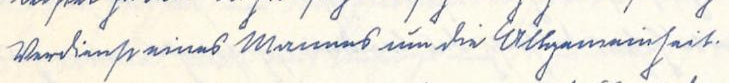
Verdienst eines Mannes um die Allgemeinheit.
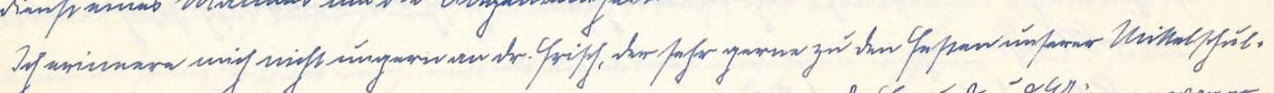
Ich erinnere mich nicht ungern an Dr. Frisch, der sehr gerne zu den Festen unserer Mittelschul-
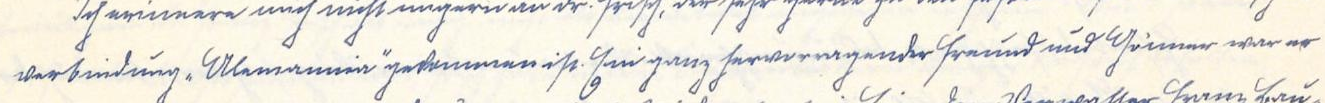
verbindung „Allemannia“ gekommen ist. Ein ganz hervorragender Freund und Gönner war er
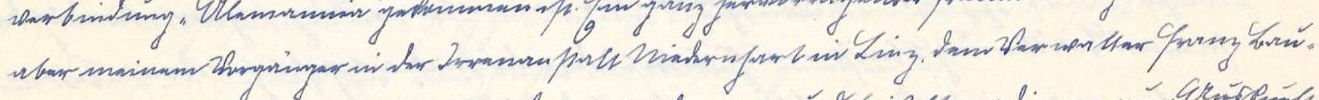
aber meinem Vorgänger in der Irrenanstalt Niedernhart bei Linz, dem Verwalter Franz Bau-
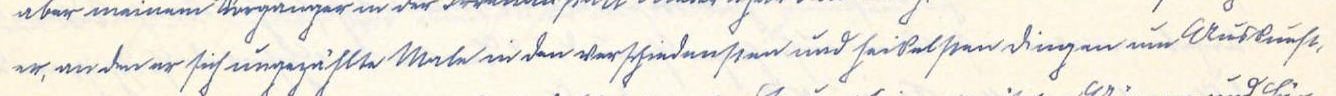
er, an den er sich ungezählte Male in den verschiedensten heikelsten Dingen um Auskunft,
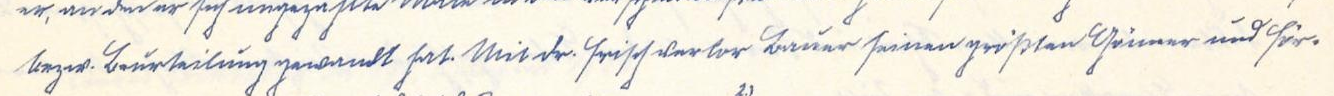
bzw. Beurteilung gewandt hat. Mit Dr. Frisch verlor Bauer seinen größten Gönner und För-
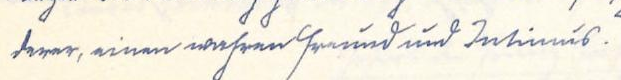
derer, einen wahren Freund und Intimus. …2)
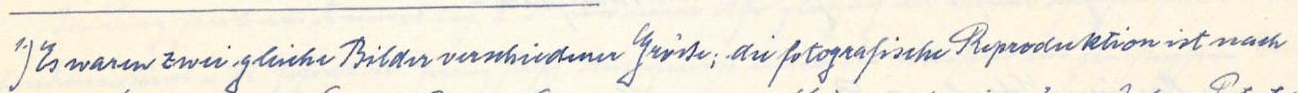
1) Es waren zwei gleiche Bilder verschiedener Größe; Die fotographische Reproduktion ist nach
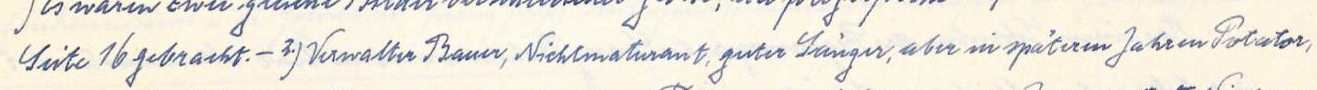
Seite 16 gebracht. 2) Verwalter Bauer, Nichtmaturant, guter Sänger, aber in späteren Jahren Potator,
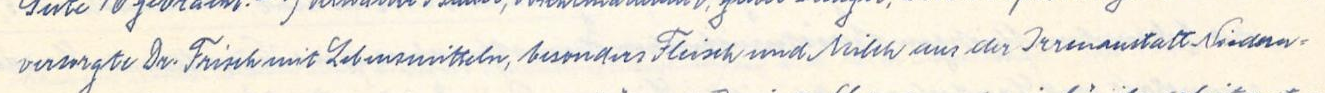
versorgte Dr. Frisch mit Lebensmitteln, besonders Fleisch und Milch aus der Irrenanstalt Niedern-
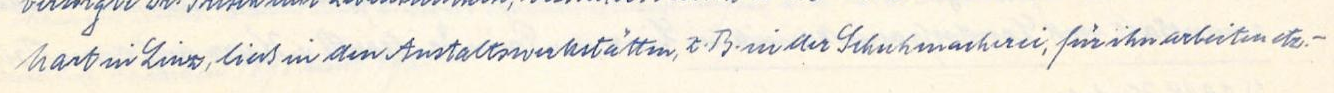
hart in Linz, lies in den Anstaltsverstätten, z. B. in der Schuhmacherei, für ihn arbeiten etc.
